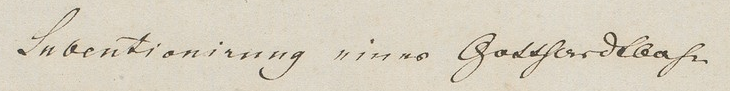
Subventionirung einer Gotthardtbahn
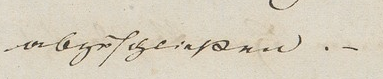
abzuschließen. –
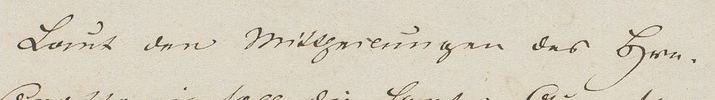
Laut den Mittheilungen des Hrn.
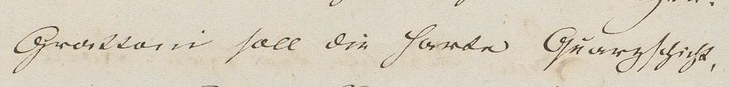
Grattoni soll die harte Quarzschicht,
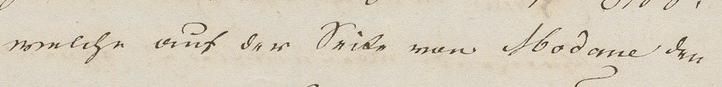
welche auf der Seite von Modane den
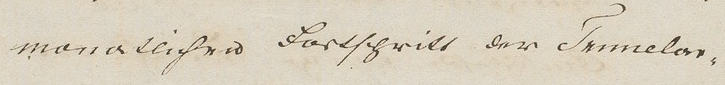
monatlichen Fortschritt der Tunnelar-
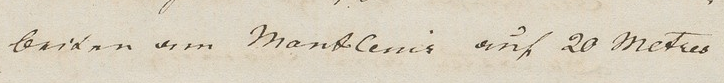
beiten am Mont Cenis auf 20 Metres
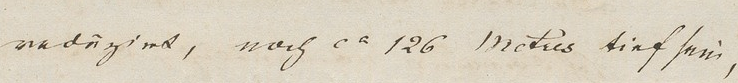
reduzirt, noch ca 126 Metres tief sein,
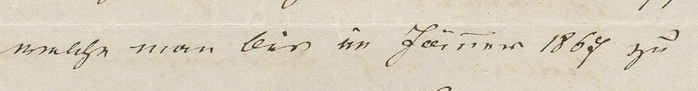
welche man bis im Jänner 1867 zu
